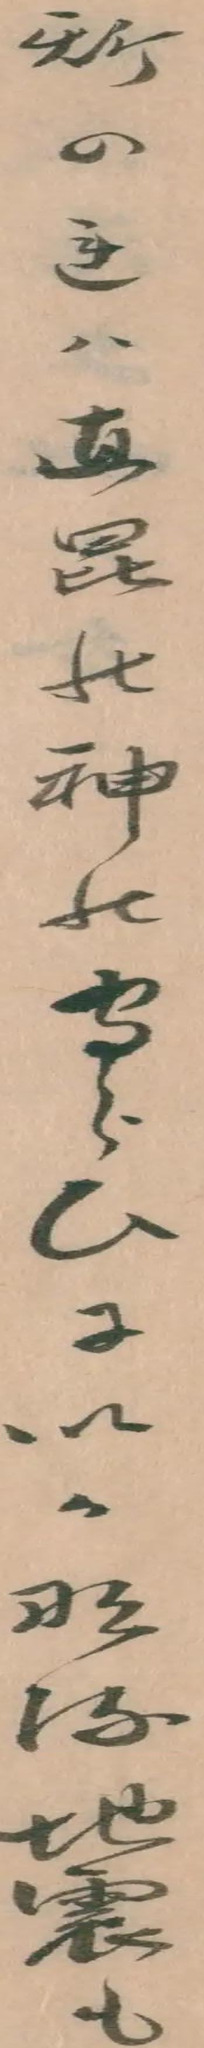斯のれは直昆の神の守らひにいかなる地震も
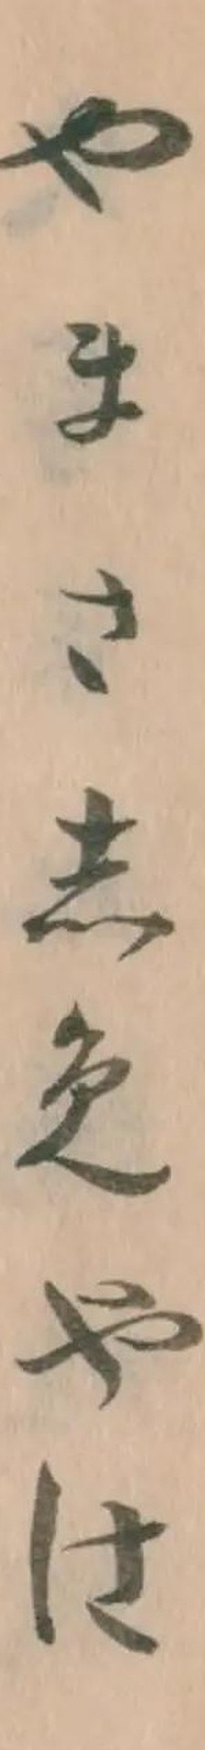やまさしめやは

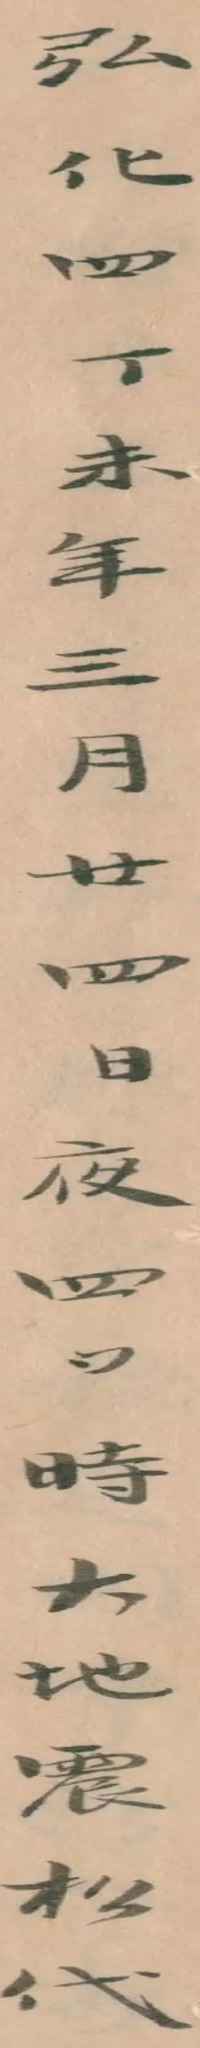弘化四丁未年三月廿四日夜四ツ時大地震松代
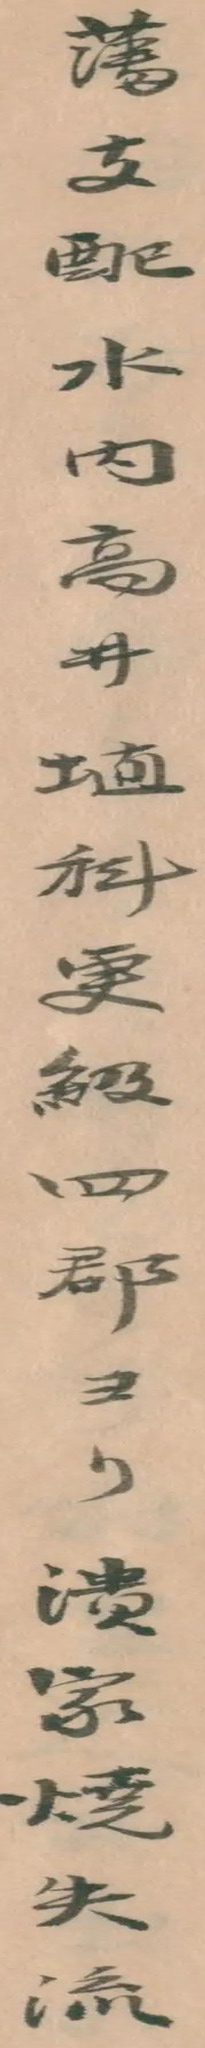藩支配水内高井埴科更級四郡ヨリ潰家焼失流
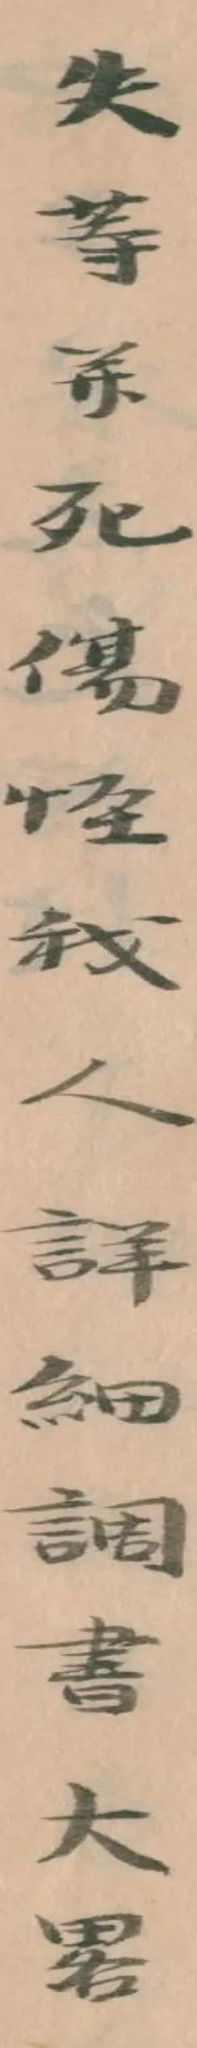失等并死傷怪我人詳細調書大略
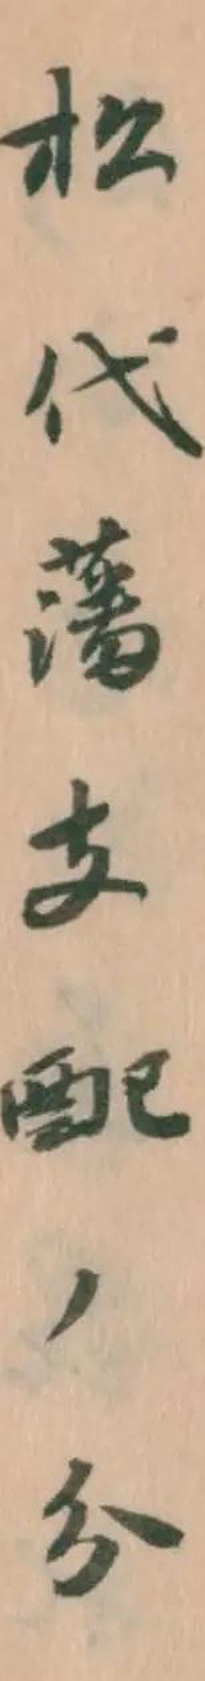松代藩支配の分
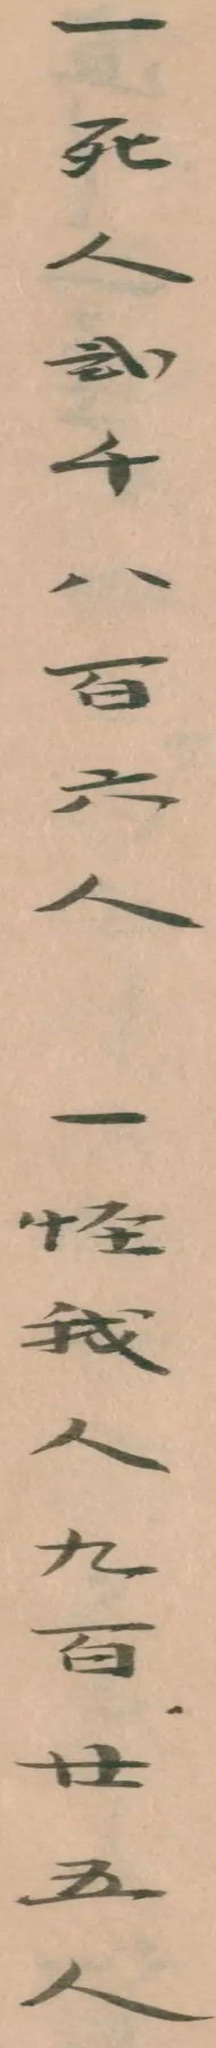一死人弐千八百六人一怪我人九百廿五人
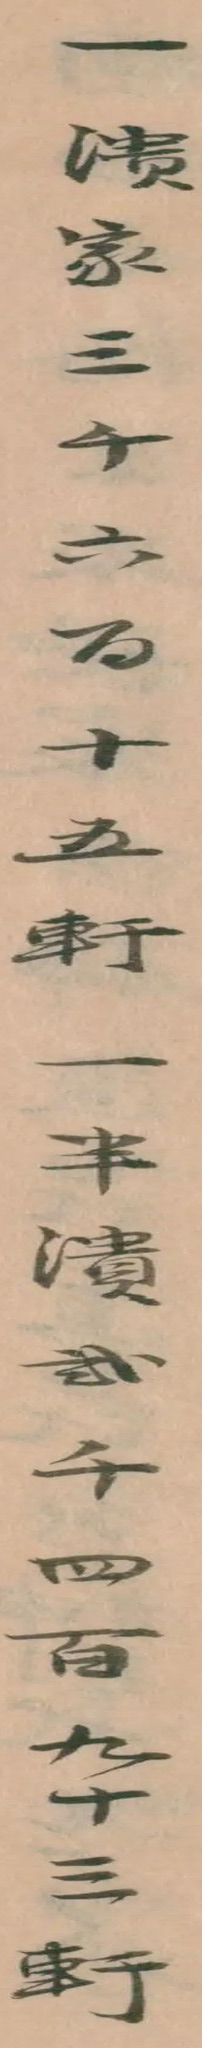一潰家三千六百十五軒一半潰弐千四百九十三軒
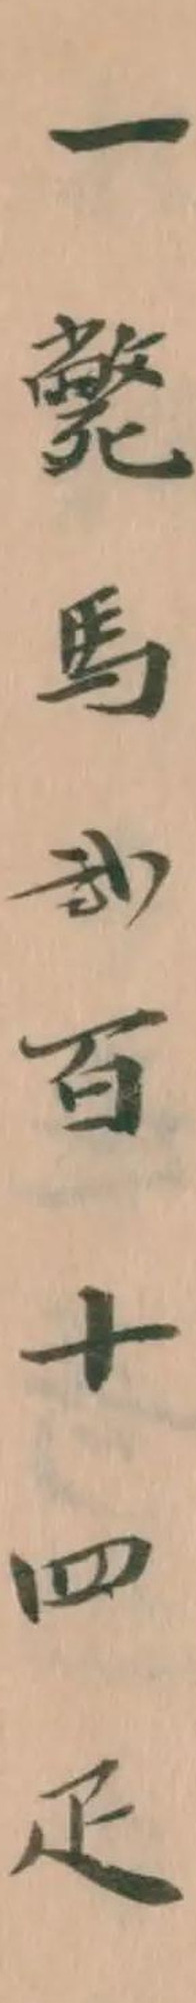一斃馬弐百十四疋
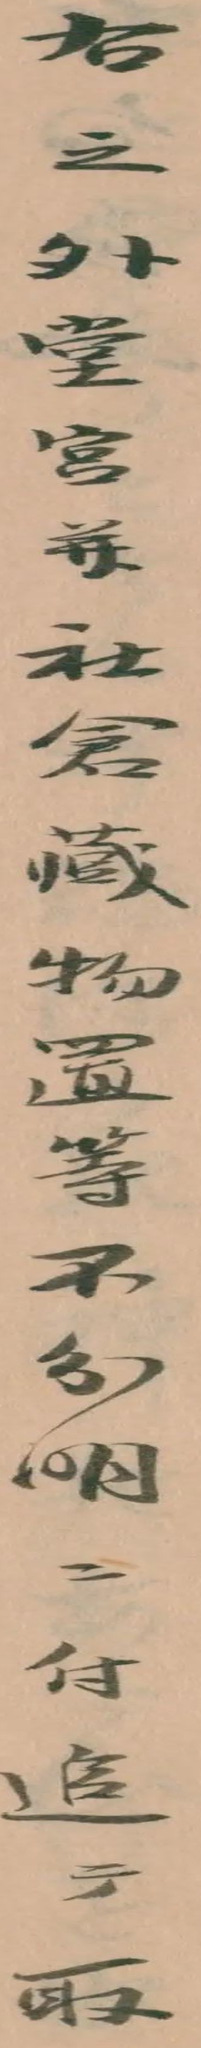右之外堂宮并社倉藏物置等不分明ニ付追テ取
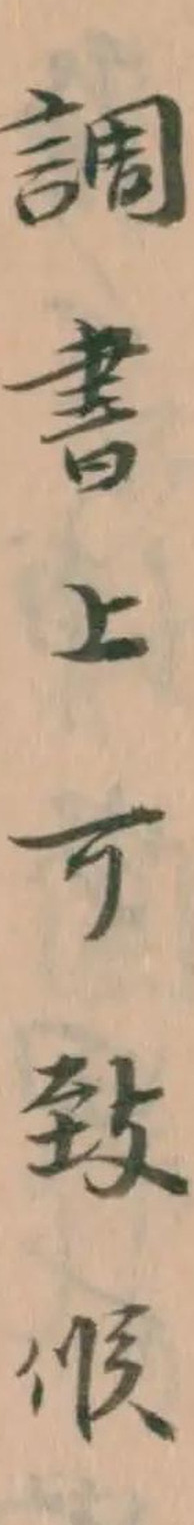調書上可致候
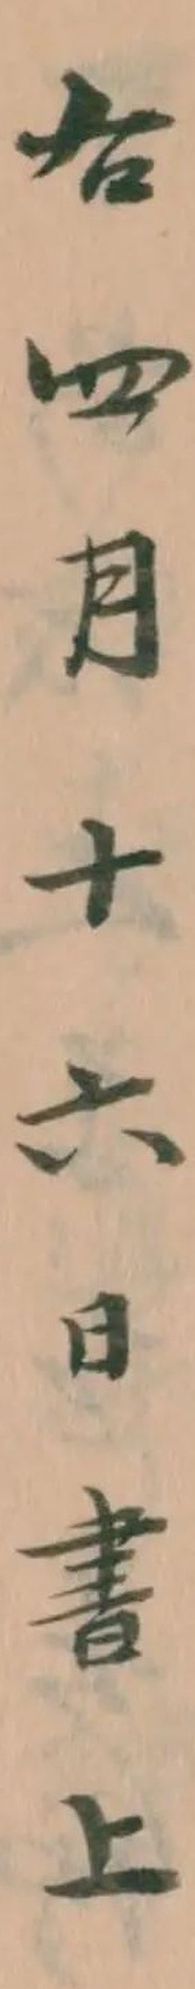右四月十六日書上
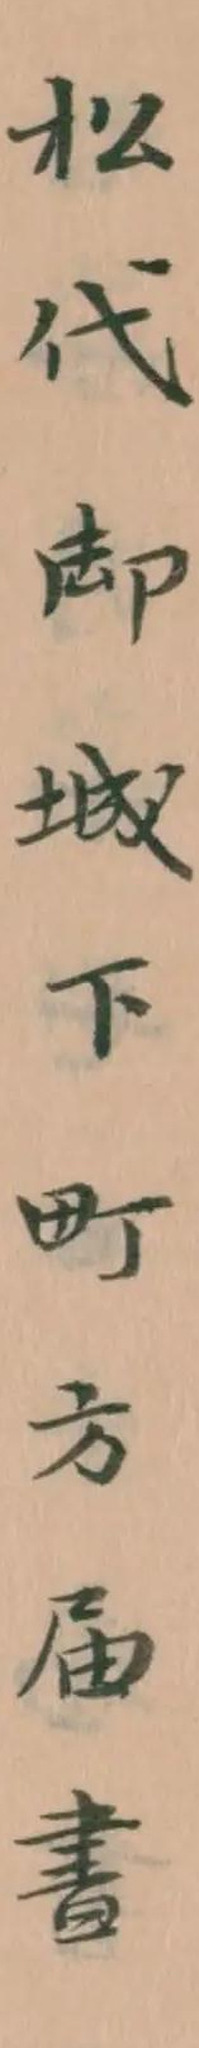松代御城下町方届書
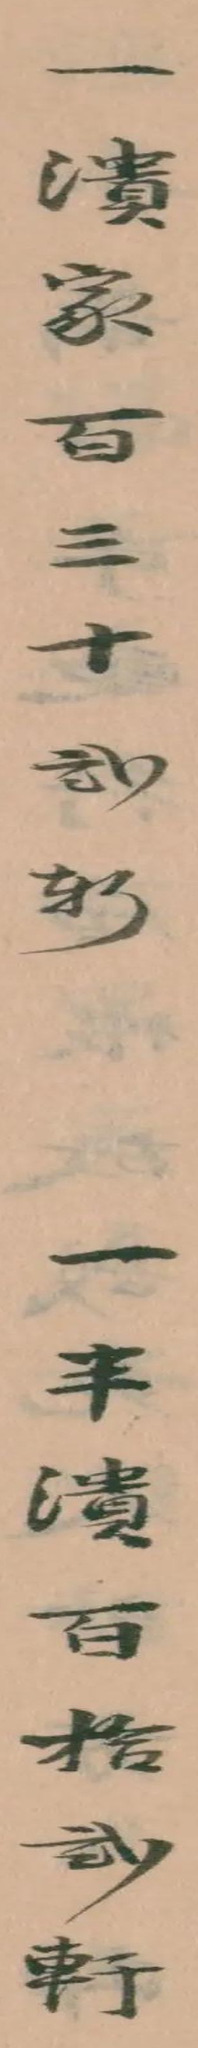一潰家百三十弐軒一半潰百拾弐軒
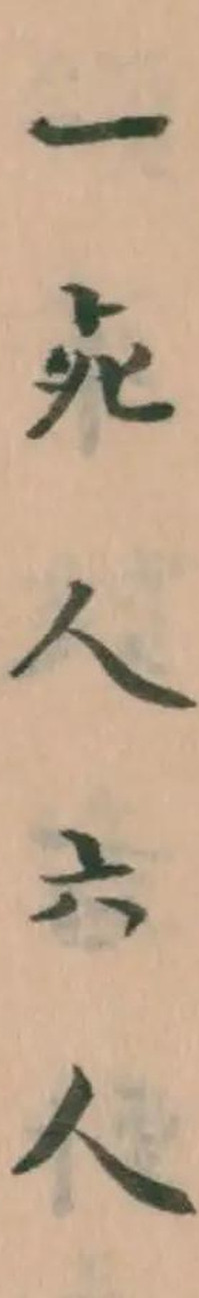一死人六人
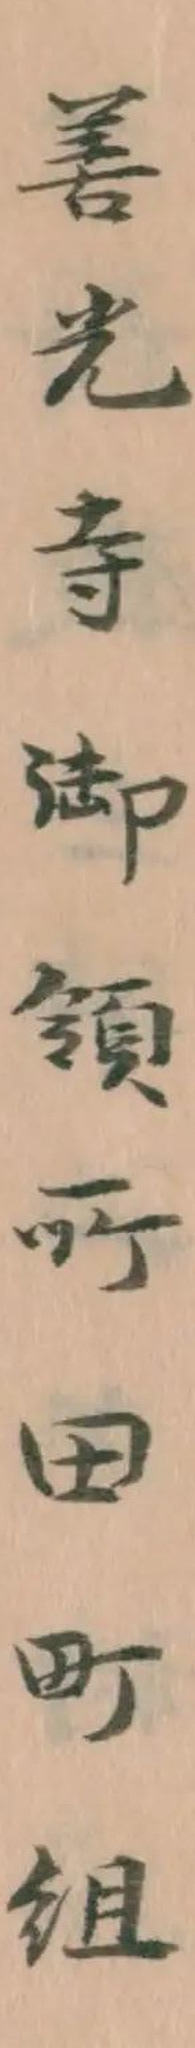善光寺御領所田町組
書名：地災撮要. 巻5-6(地震之部)
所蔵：国立国会図書館 National Diet Library, JAPAN
